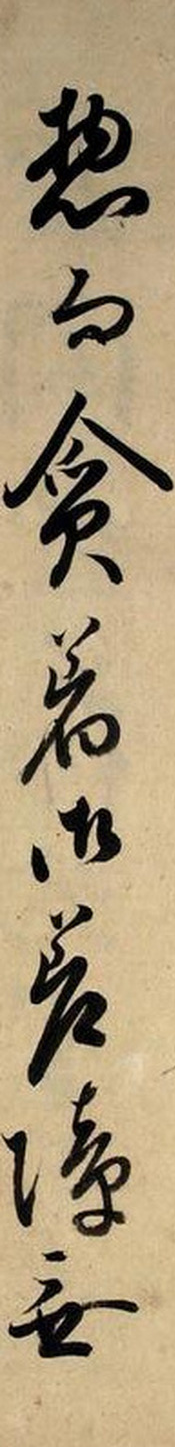惣而貪着御差障無
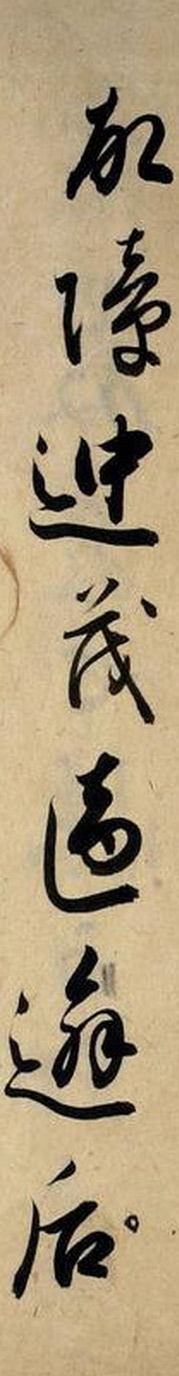故障迚茂適邂后
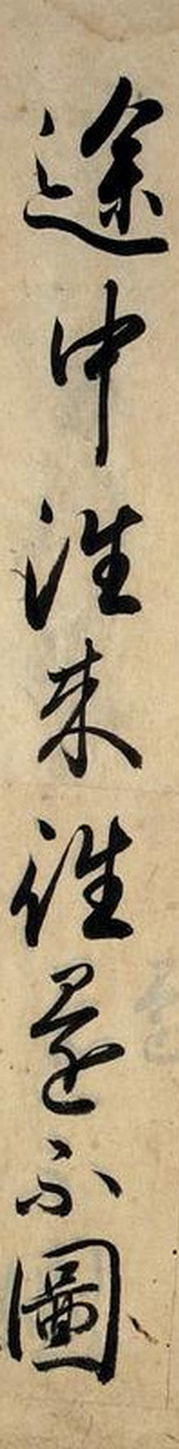途中往来往懸不図
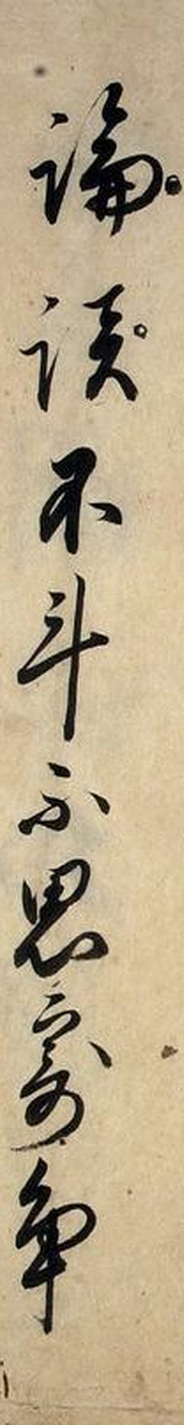論談不斗不思寄争

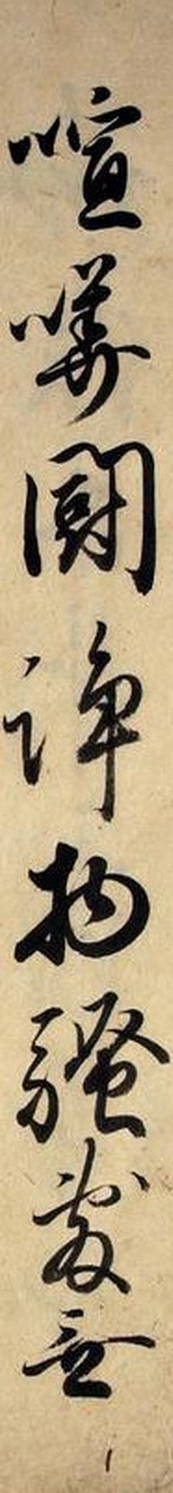喧嘩闘諍物騒敷無
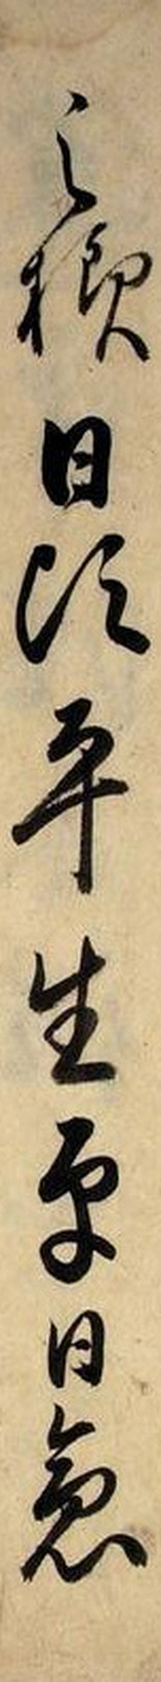之様日頃平生平日急
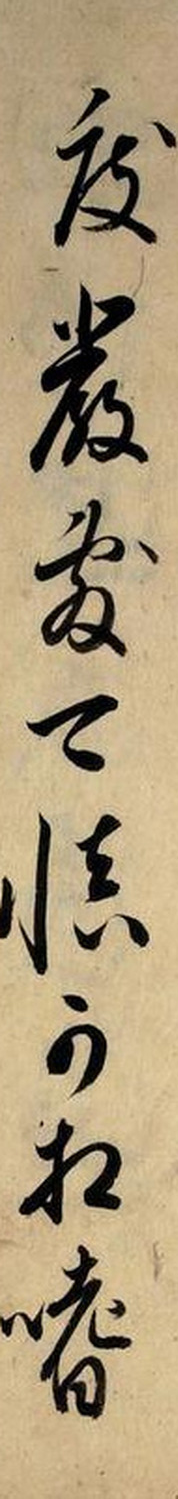度厳敷可慎可相嗜
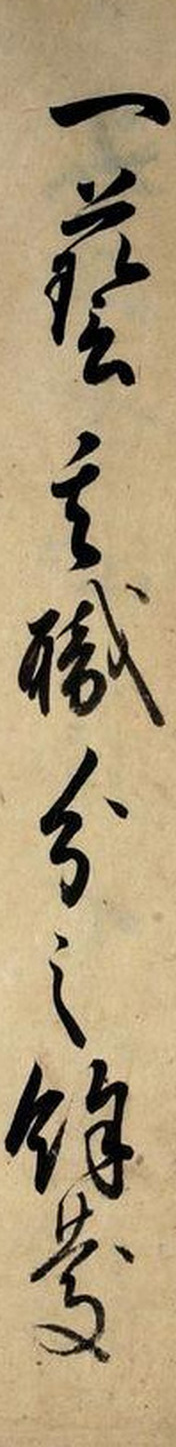一芸其職分之余慶
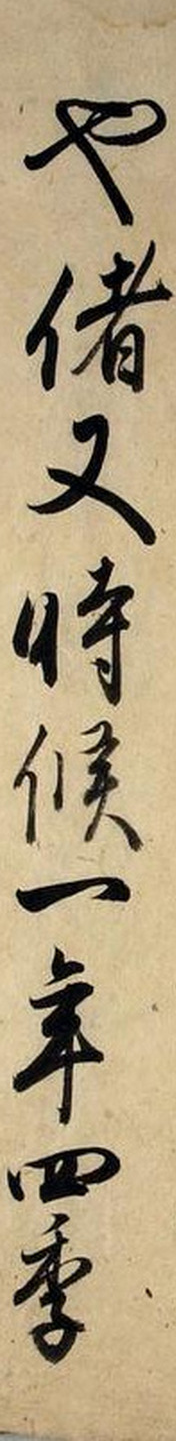也偖又時候一年四季
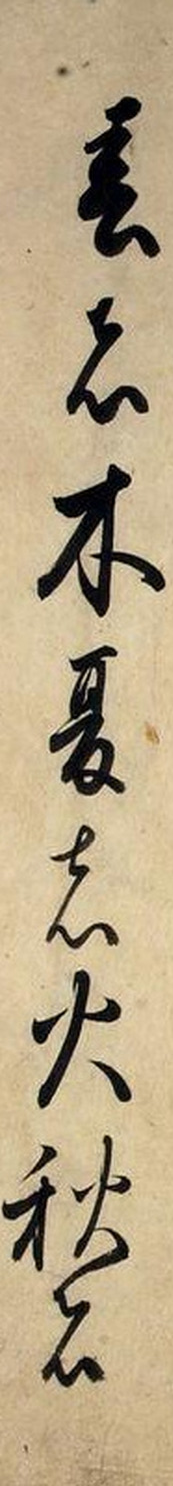春は木夏は火秋は

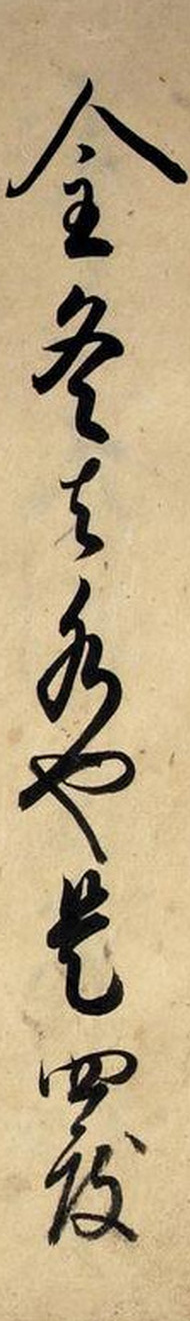金冬は水也是四度
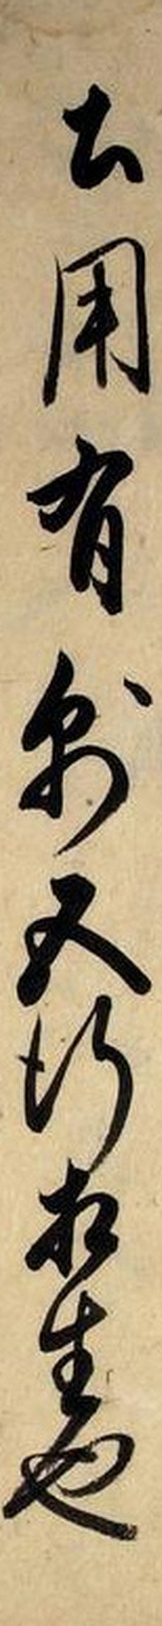土用有則五行相生也
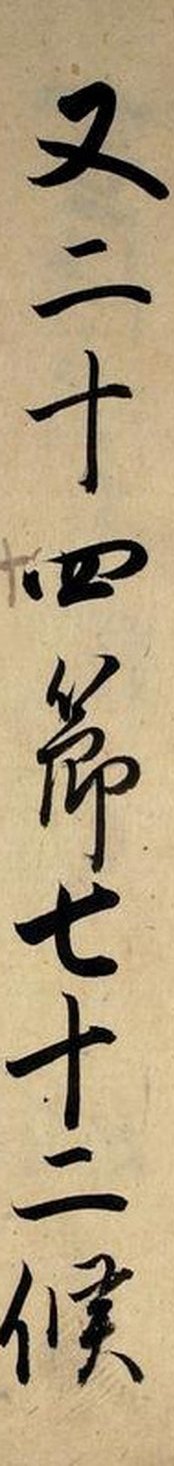又二十四節七十二候
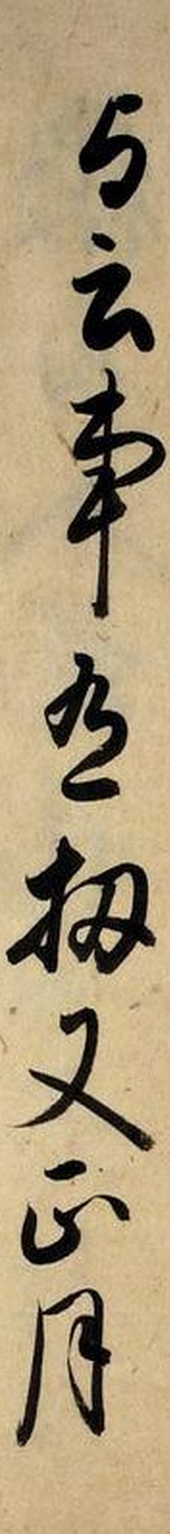与云事有扨又正月
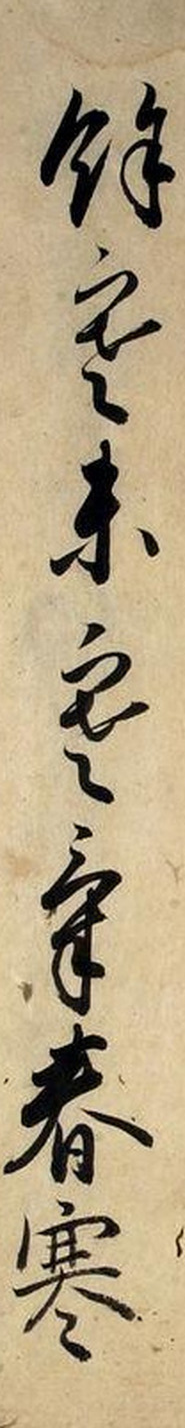余寒末寒気春寒
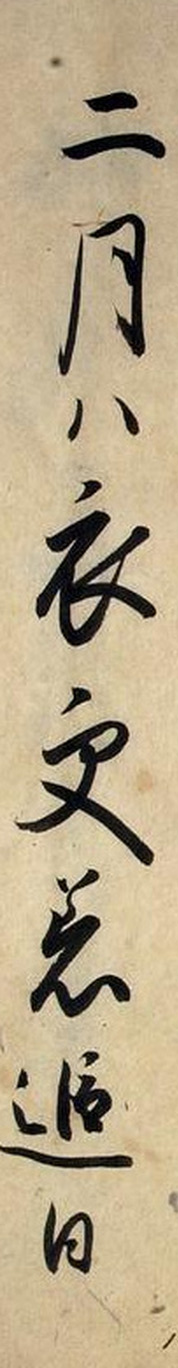二月ハ衣更着追日
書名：消息千字文（往来物、手習手本）
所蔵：福井県文書館 Fukui Prefectural Archives
